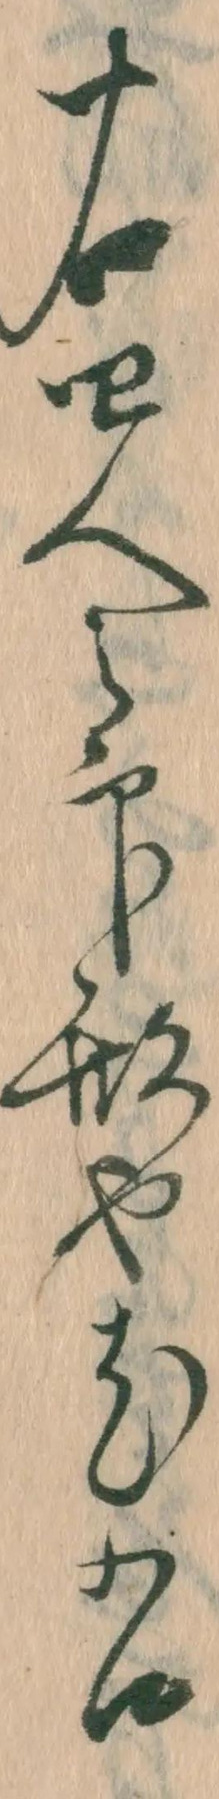右四人之印形也尤右
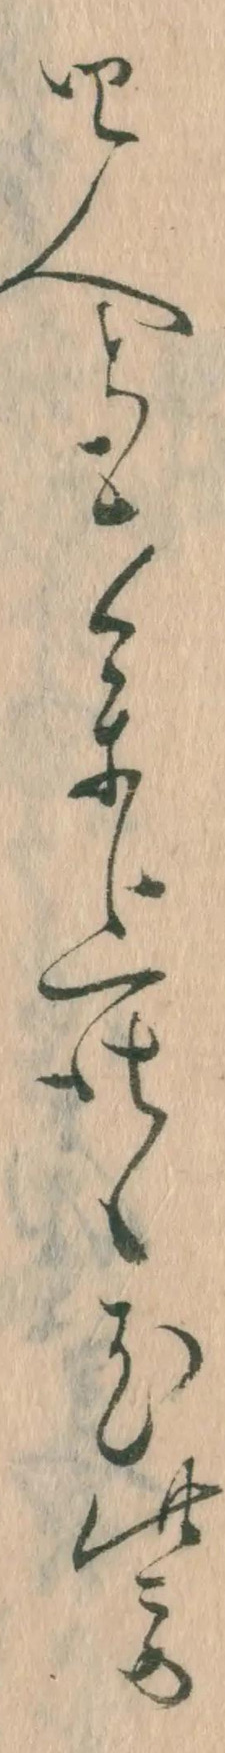四人とも参上仕候尤此方
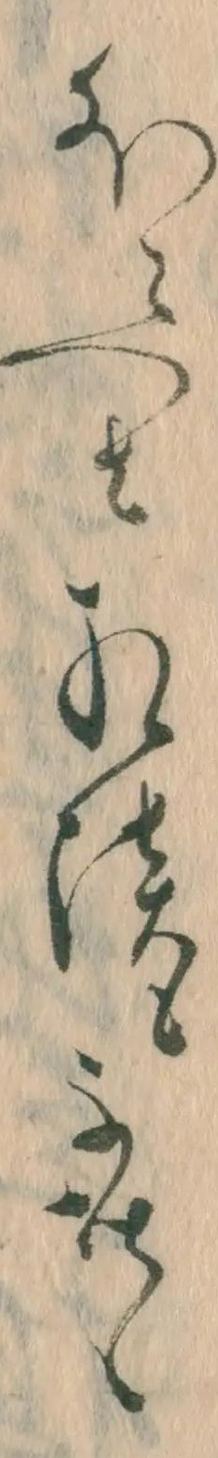外々へ者相談も不仕候

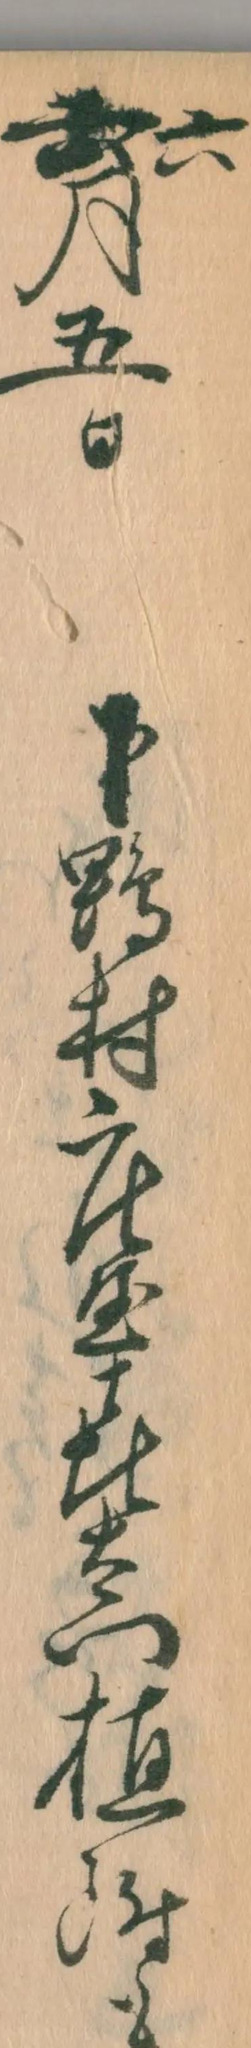六月五日下鴨村庄屋喜右衛門植附も
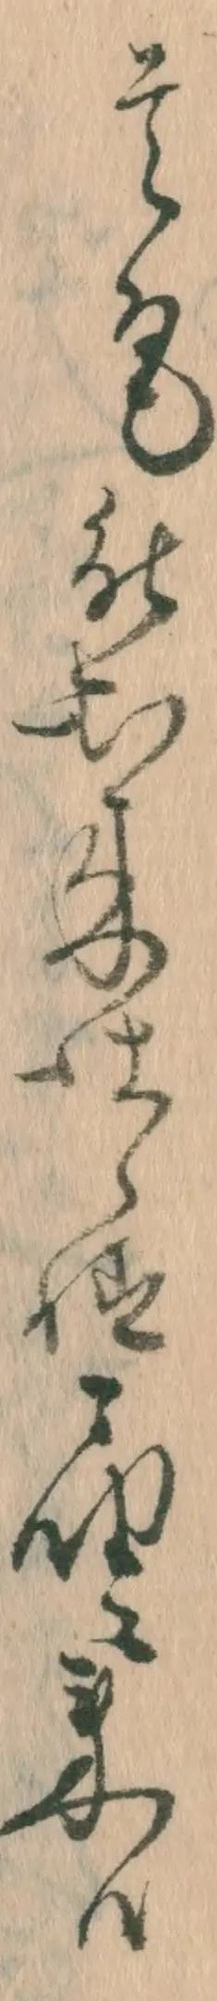首尾能出来仕候様届ニ来ル
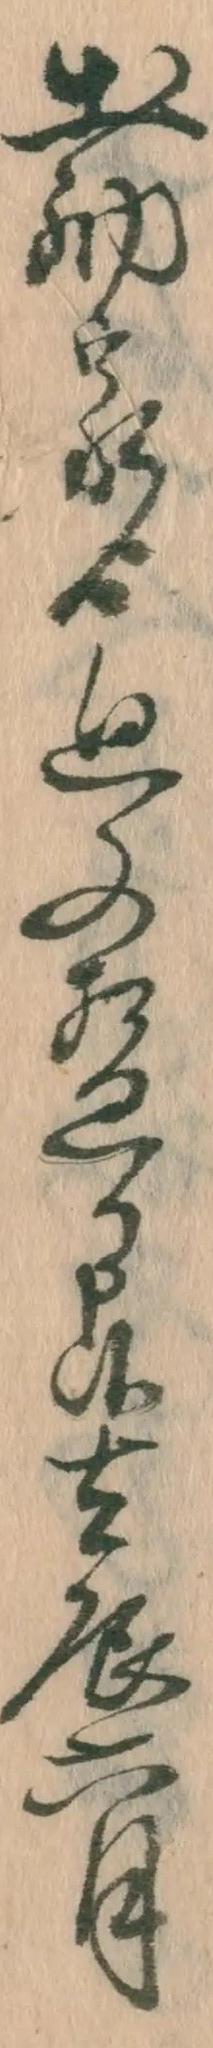六日出納家ゟ廻文相廻り申候去辰六月
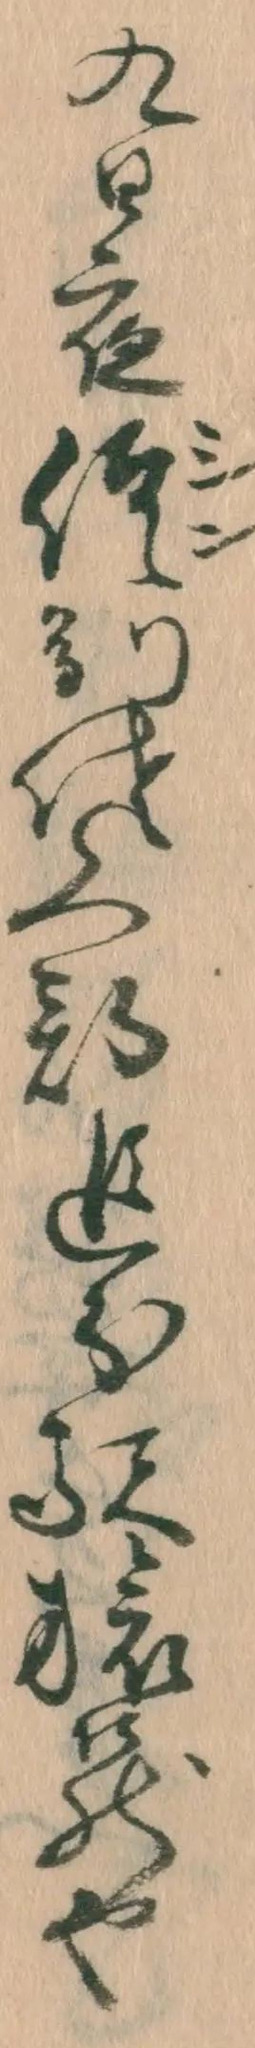九日夜信州佐久郡追分駅旅籠や
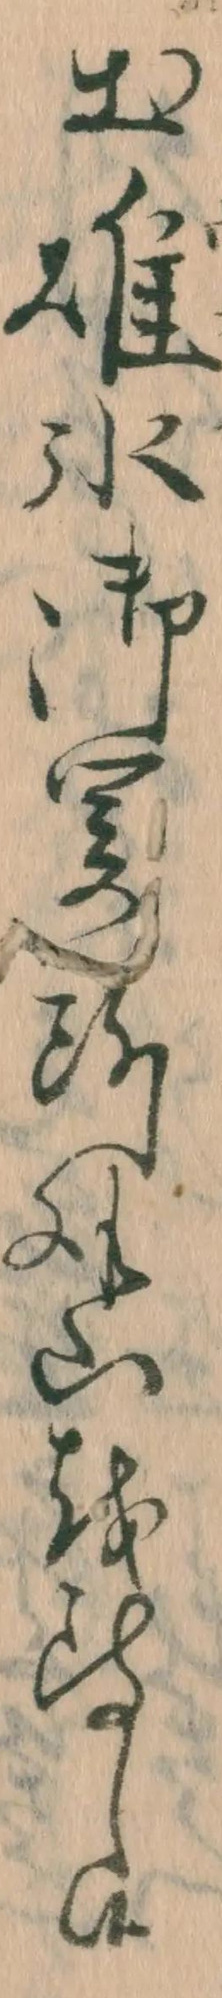出碓氷御関所外山越致し候
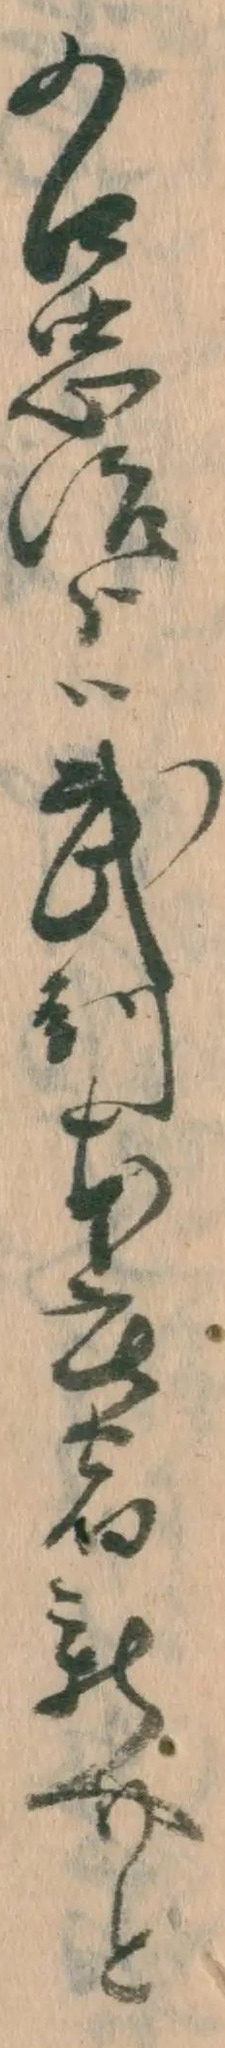右忠治郎ハ武州本庄宿新介と
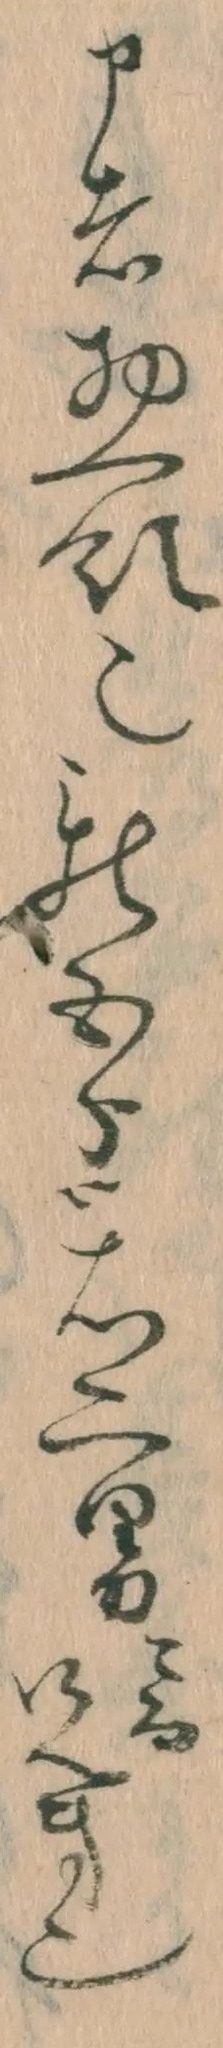申者惣領也新五郎ハ右二男ニ而兄弟也
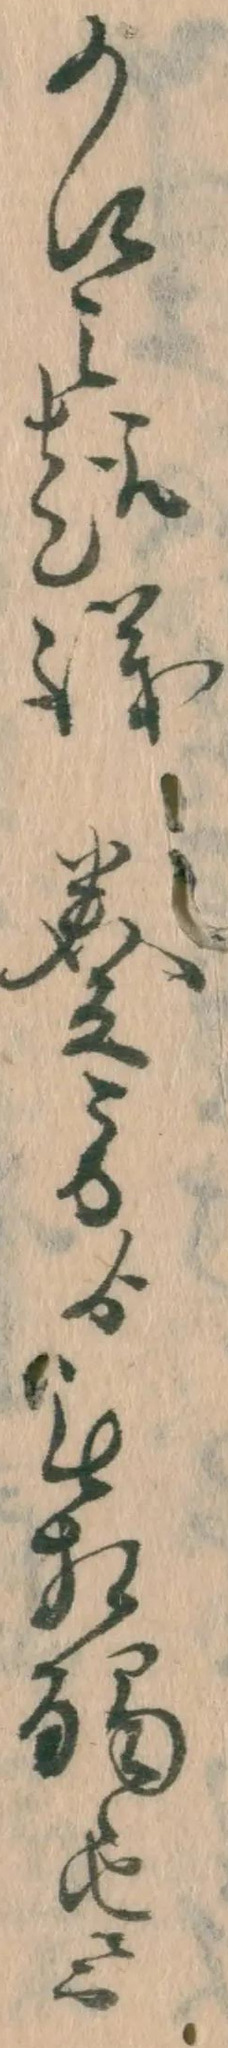右之趣儀奏方ゟ被相触候由ニ而
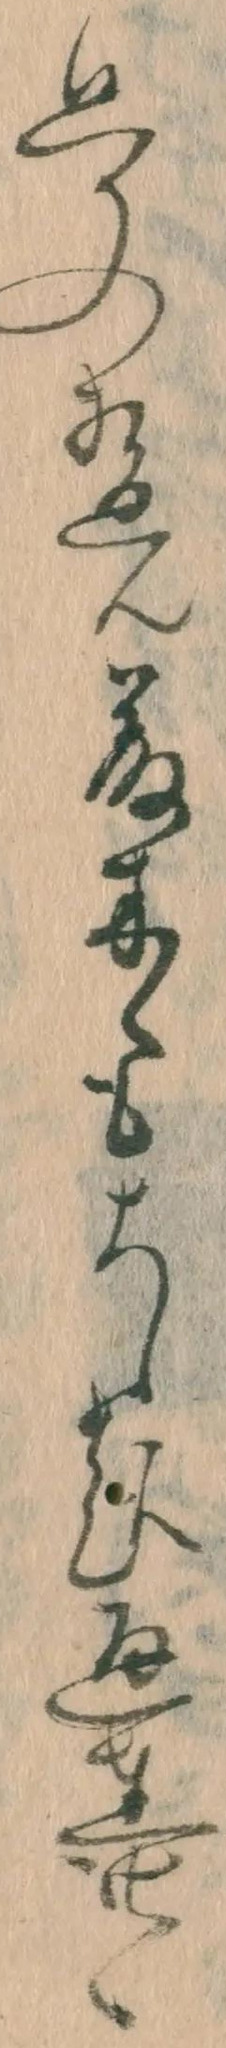且又相廻ル藤木へも右之趣通達仕候
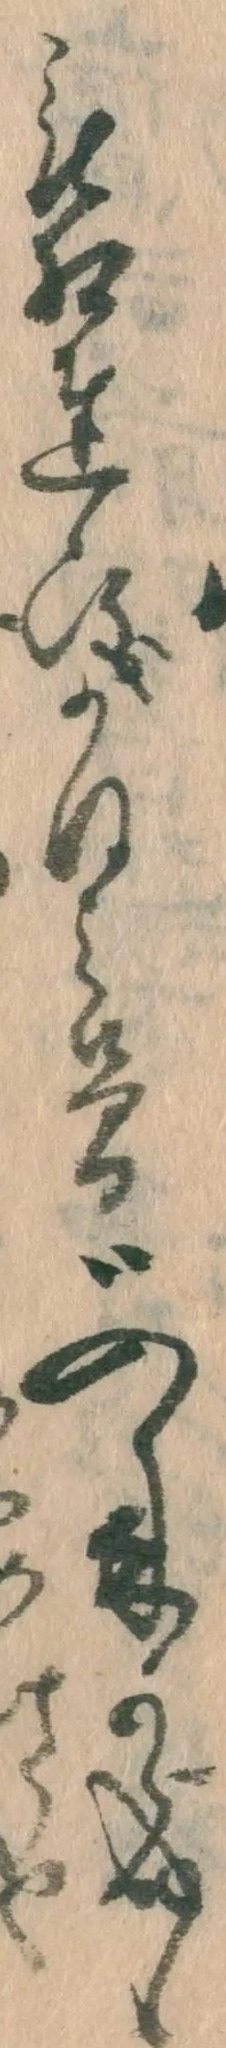被相達候儀可有之候間御入来可被成候
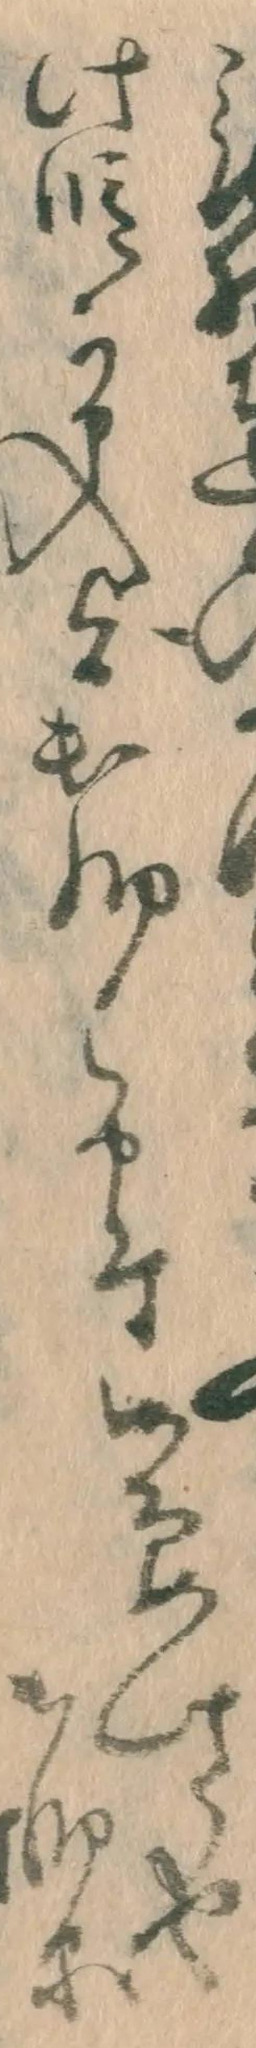此段可申入旨出納被申付仍而如此候也

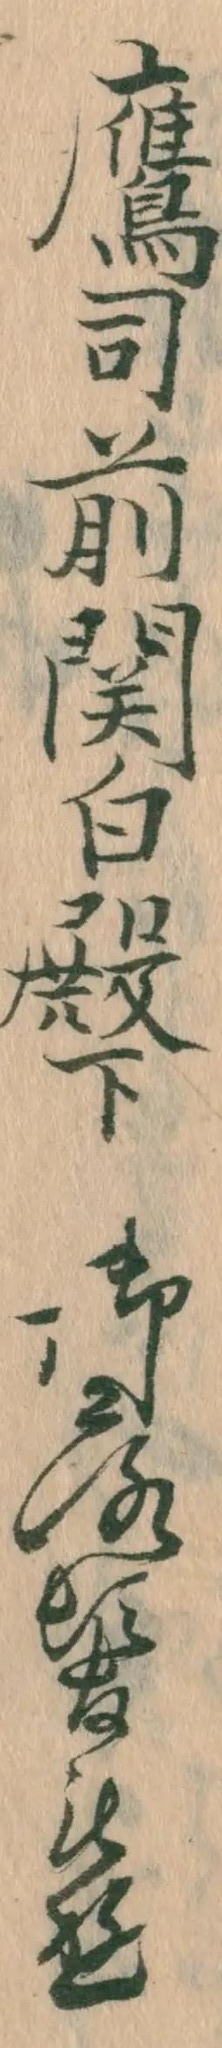鷹司前関白殿下御落髪被遊
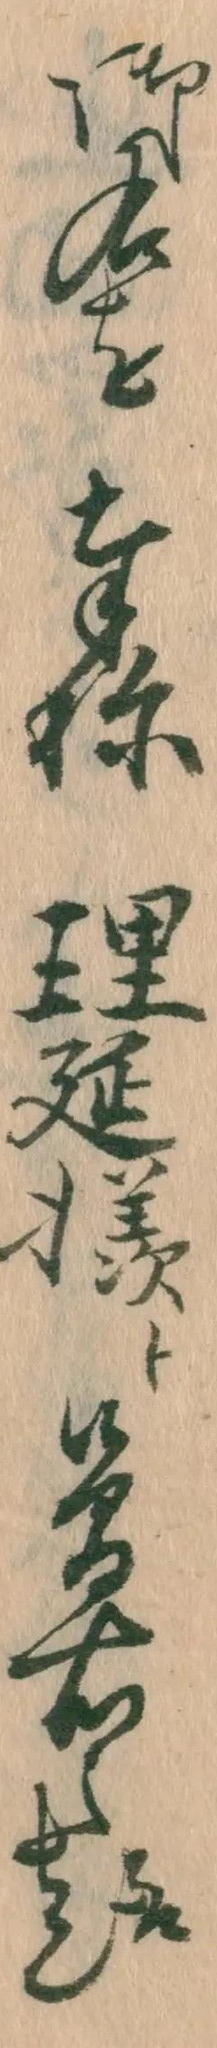御名を奉称理延様ト候間右之趣
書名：賀茂社記録. 第61冊
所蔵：国立国会図書館 National Diet Library, JAPAN
